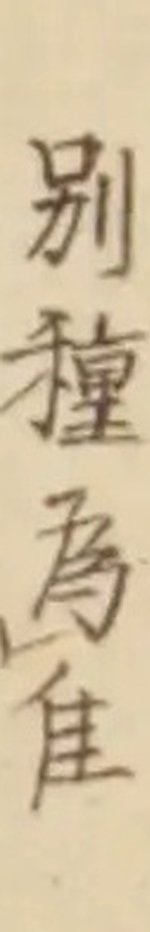別種為

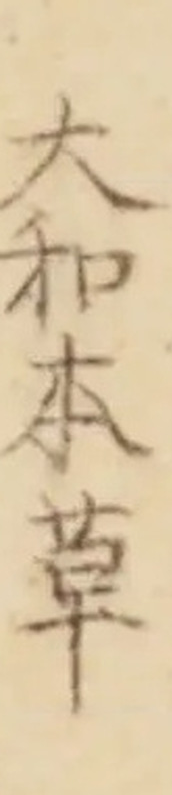大和本草
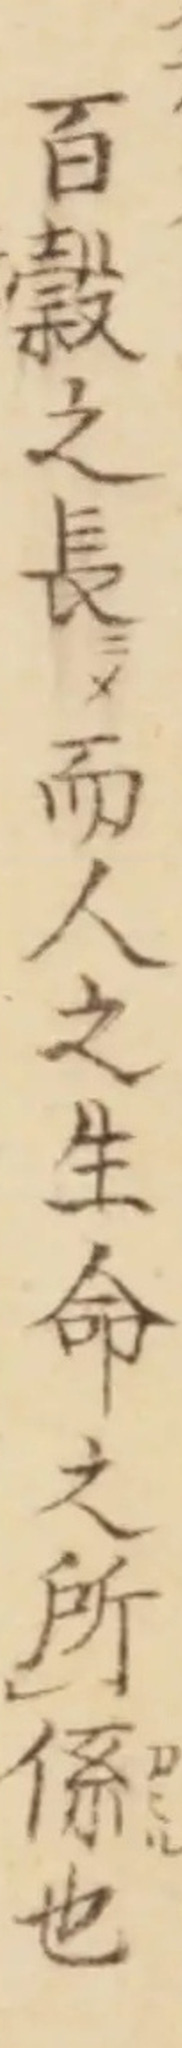百穀之長而人之生命之所係也
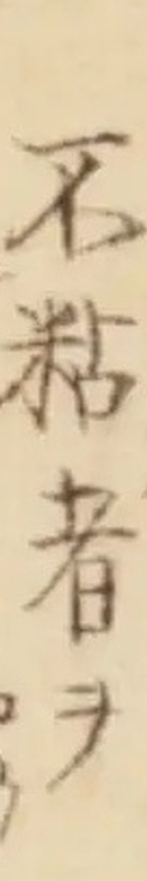不粘者ヲ
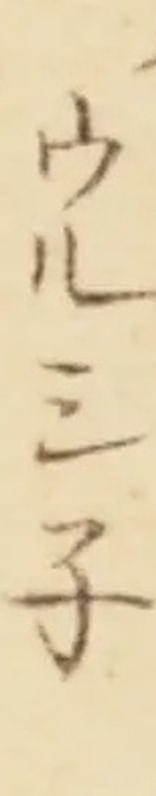ウルシネ
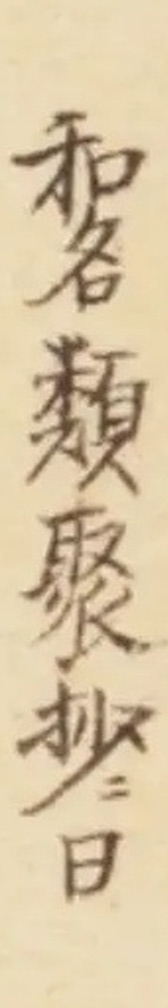和名類聚抄曰
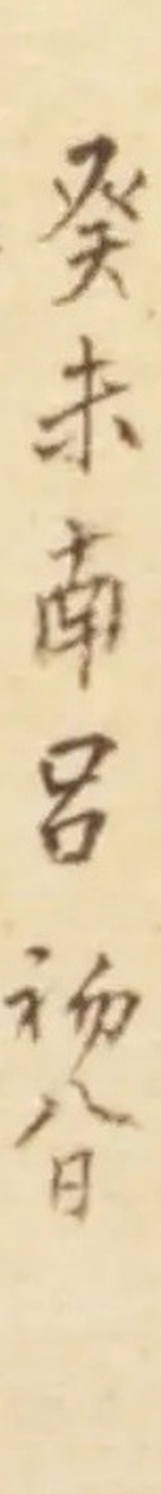癸未南呂八日
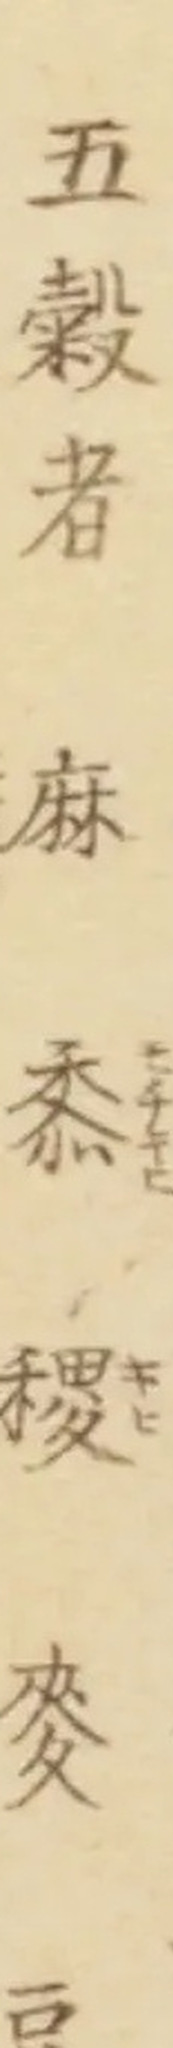五穀者麻黍稷麦豆
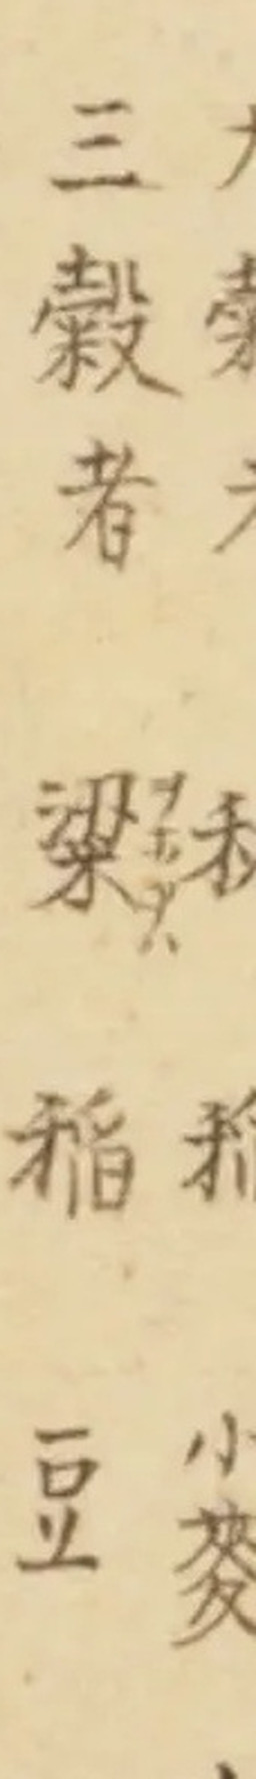三穀者粱稲豆
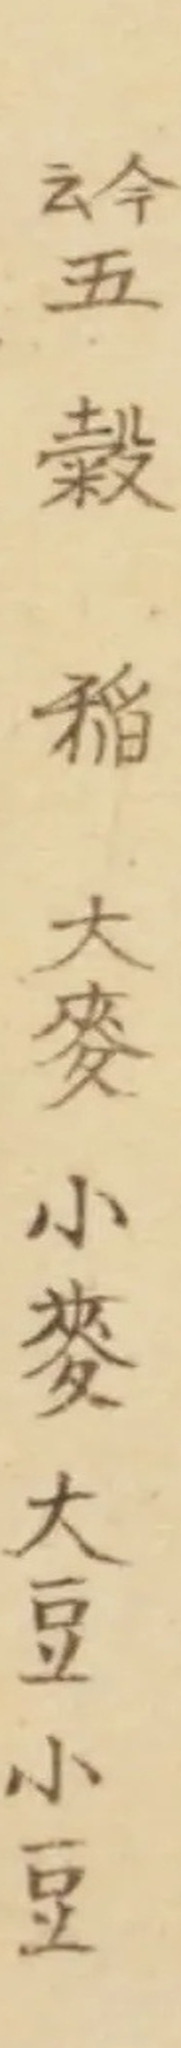今云五穀稲大麦小麦大豆小豆

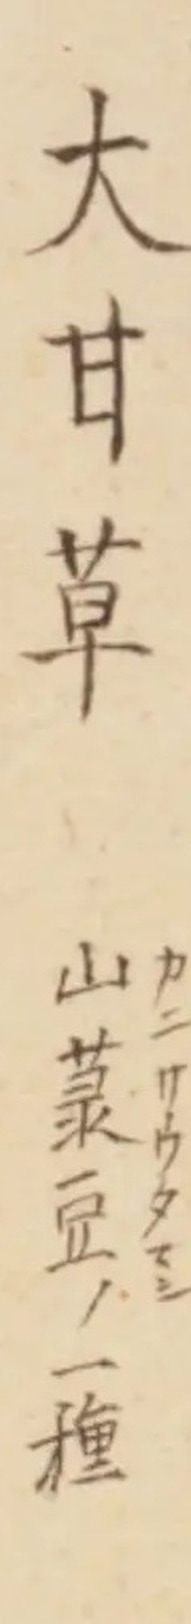大甘草山菉豆一種
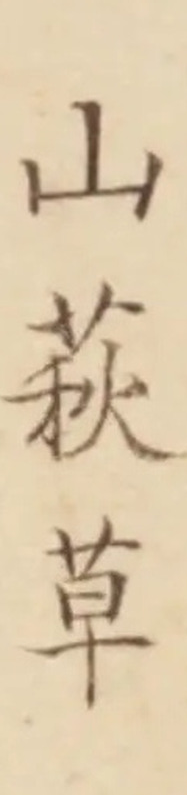山萩草
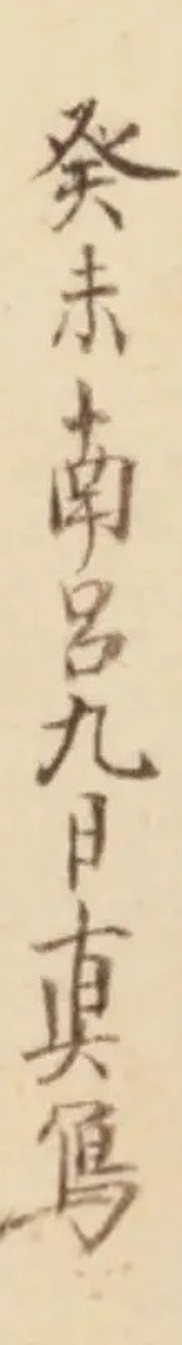癸未南呂九日真写
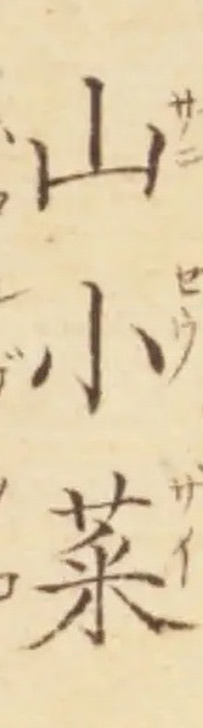山小菜
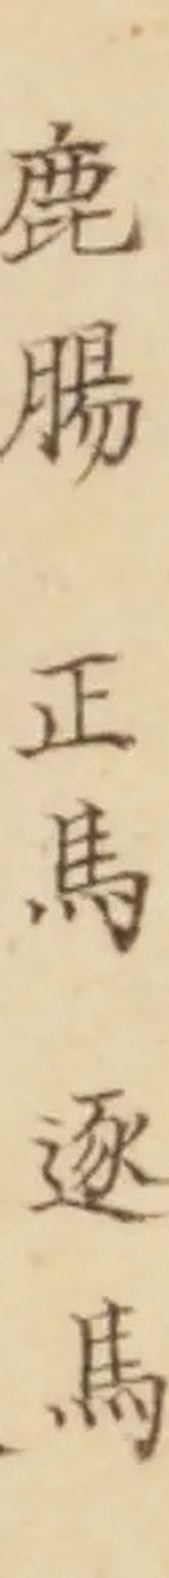鹿腸正馬逐馬
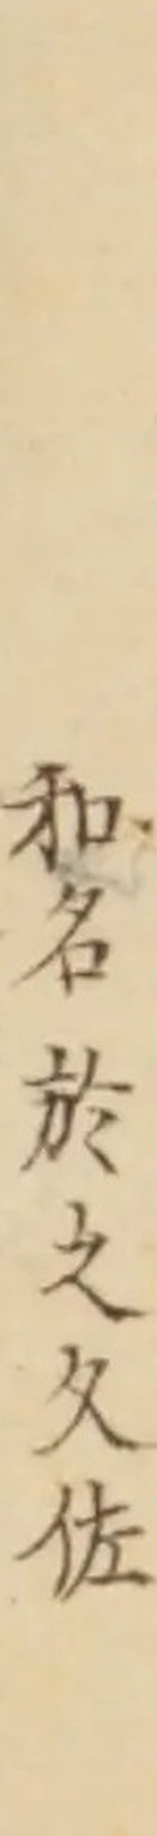和名於之夂佐
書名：梅園草木花譜秋之部. 2
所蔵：国立国会図書館 National Diet Library, JAPAN
